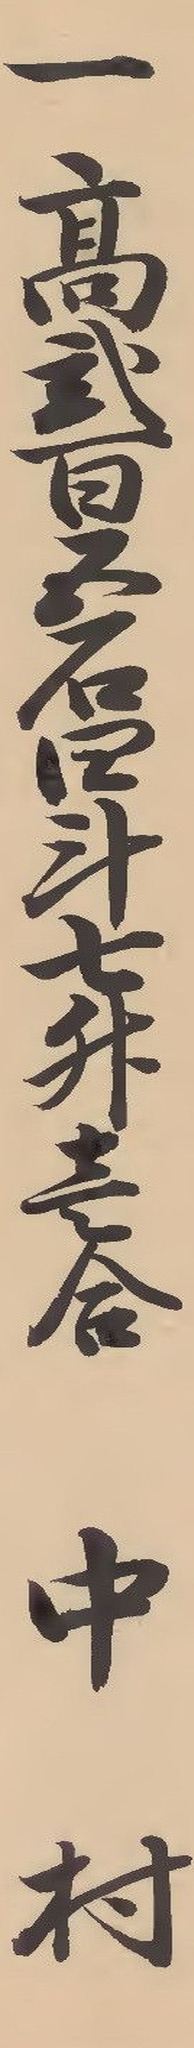一高弐百五石四斗七升壱合中村
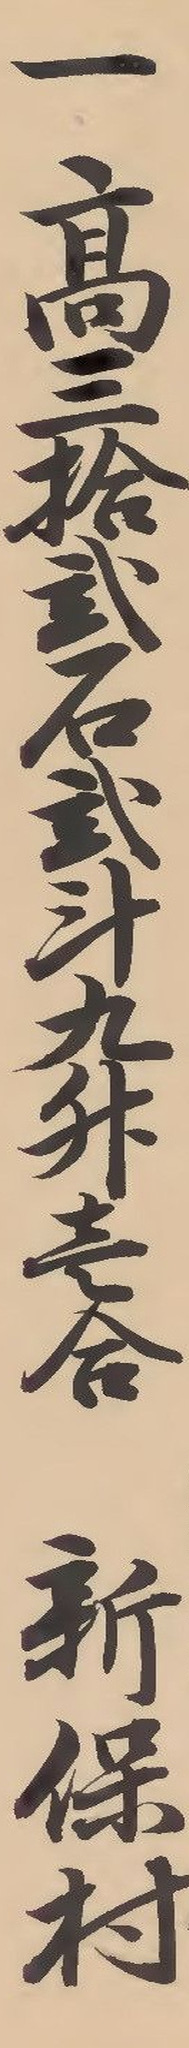一高三拾弐石弐斗九升壱合新保村
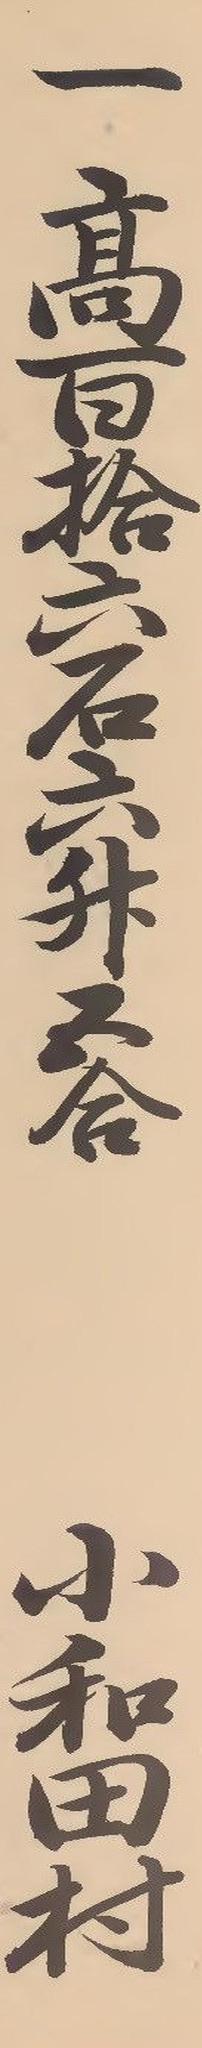一高百拾六石六升五合小和田村
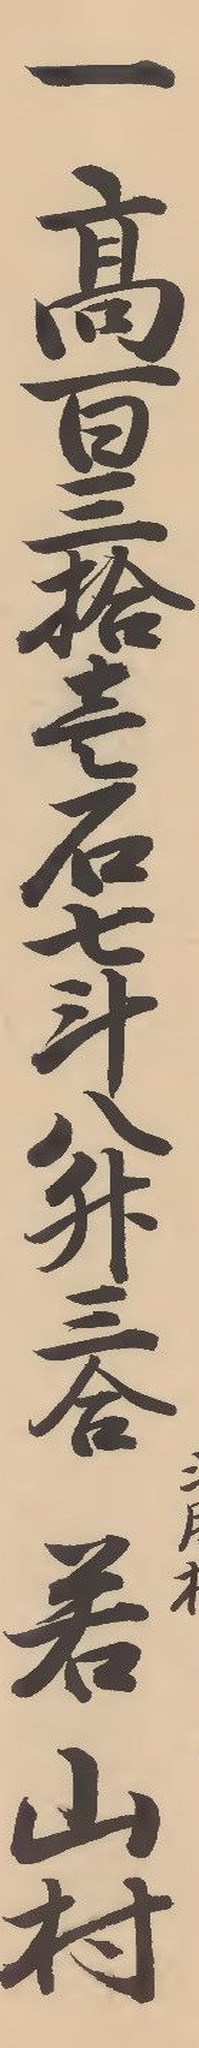一高百三拾壱石七斗八升三合若山村
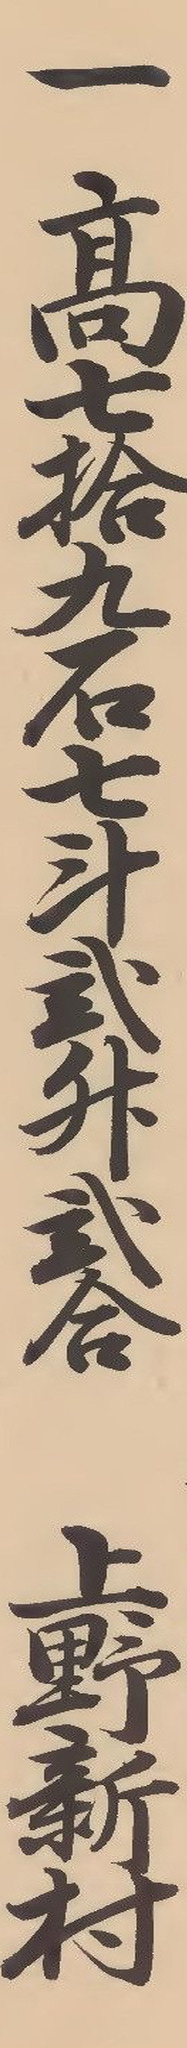一高七拾九石七斗弐升弐合上野新村
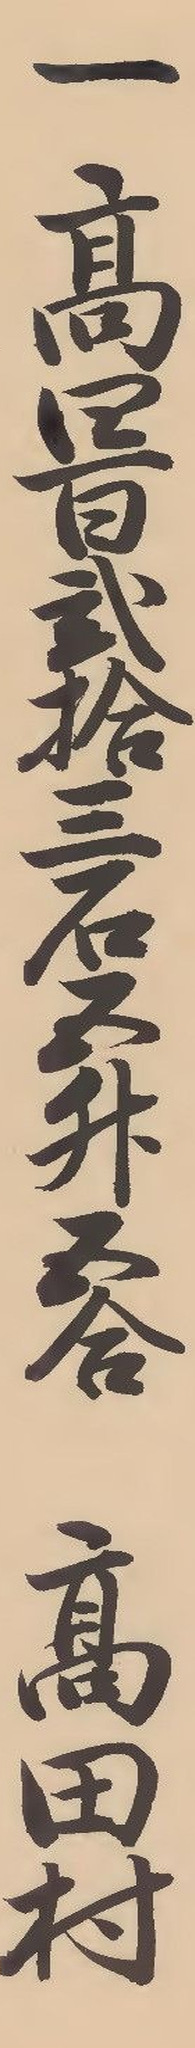一高四百弐拾三石五升五合高田村

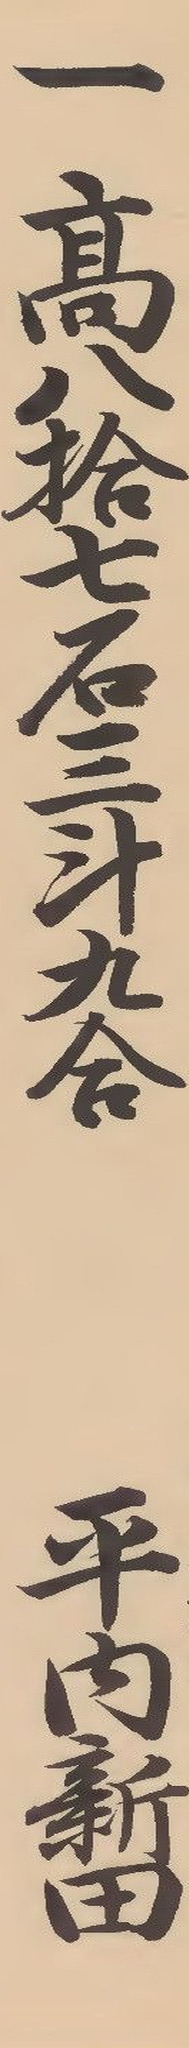一高八拾七石三斗九合平内新田
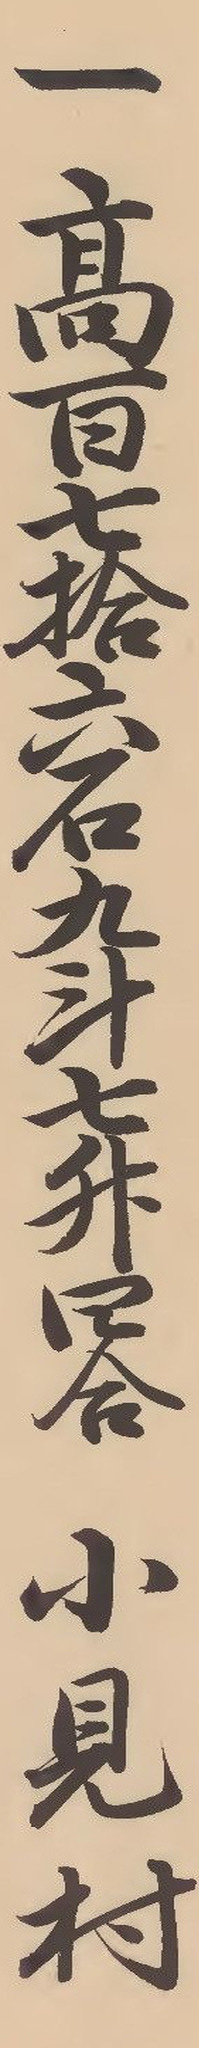一高百七拾六石九斗七升四合小見村
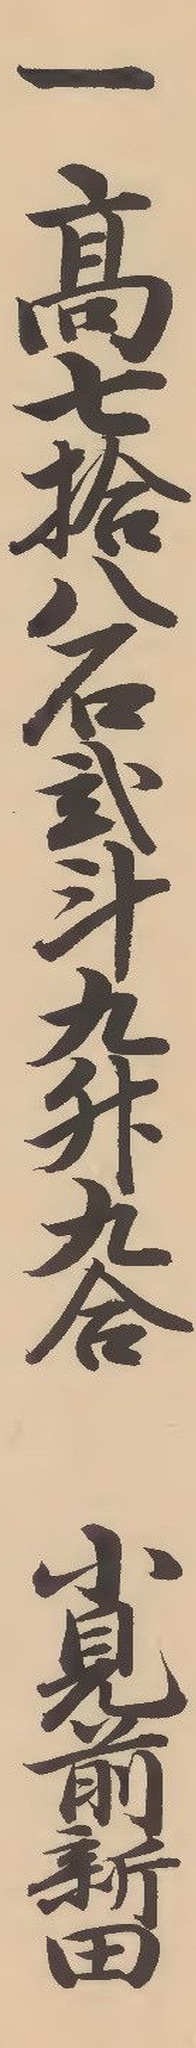一高七拾八石弐斗九升九合小見前新田
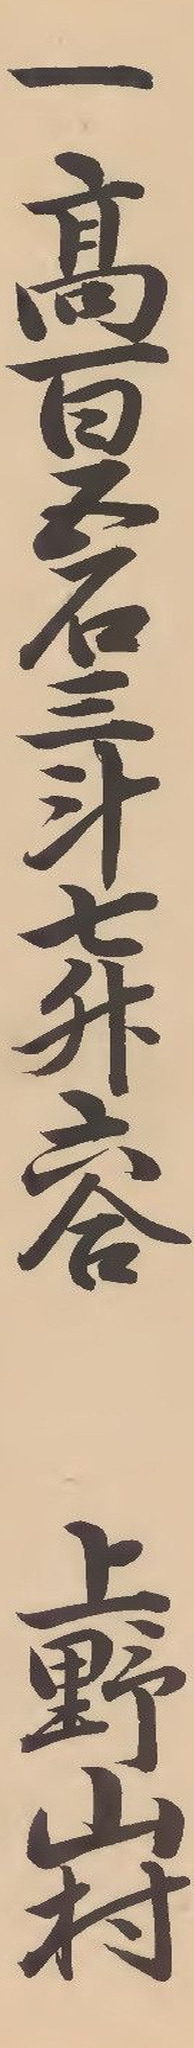一高百五石三斗七升六合上野山村
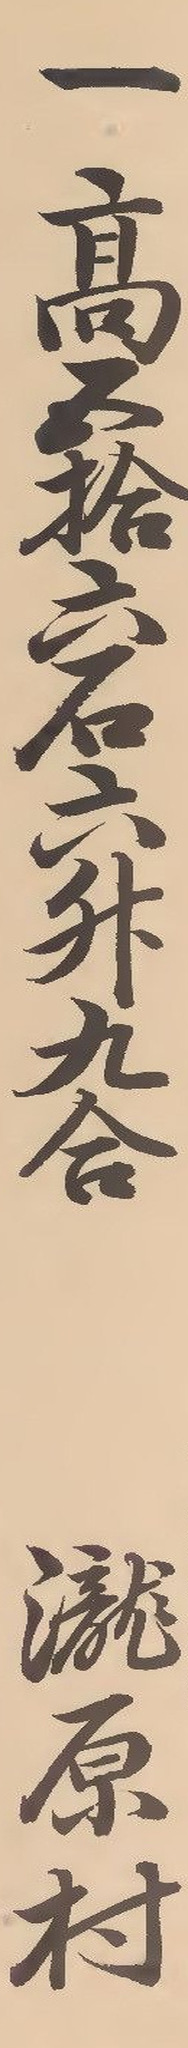一高五拾六石六升九合滝原村
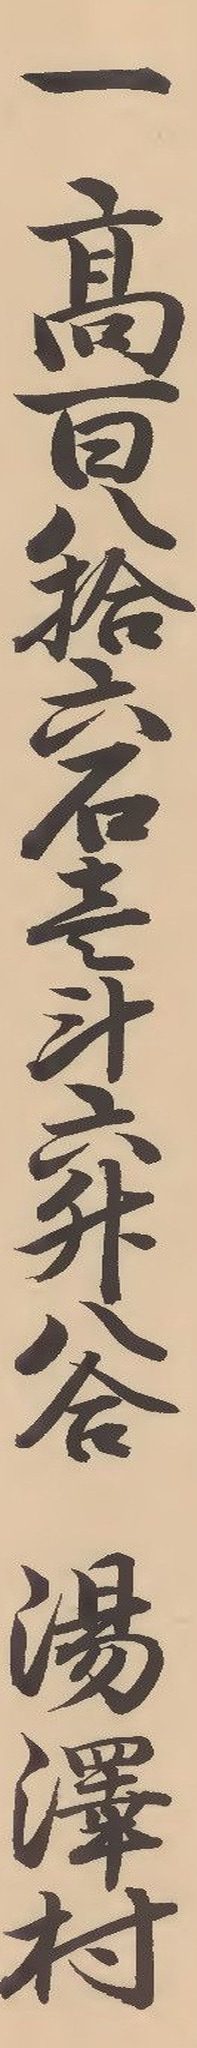一高百八拾六石壱斗六升八合湯沢村
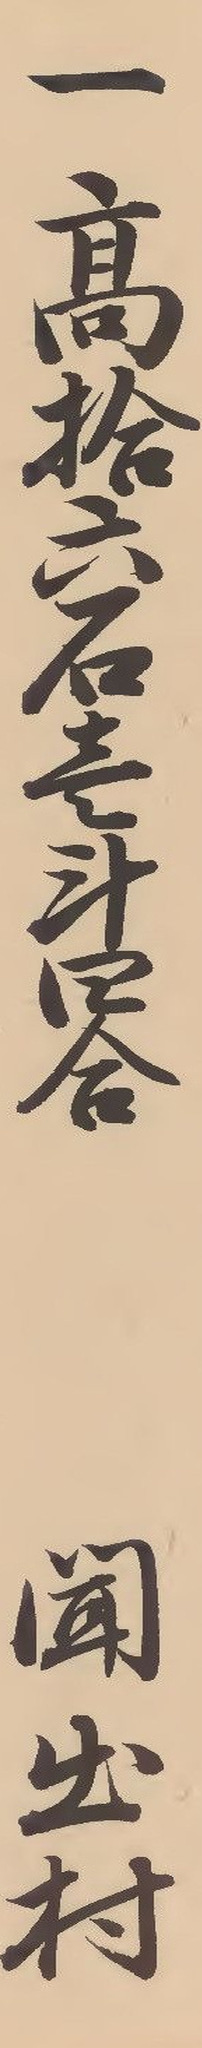一高拾六石壱斗四合聞出村
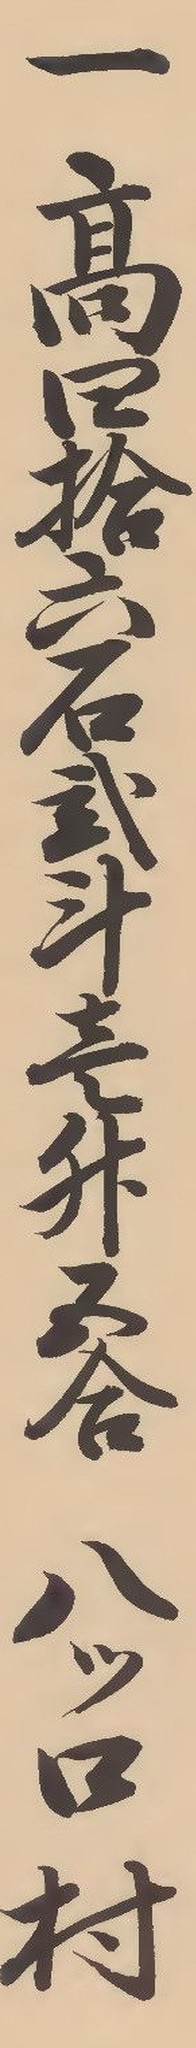一高四拾六石弐斗壱升五合八ッ口村

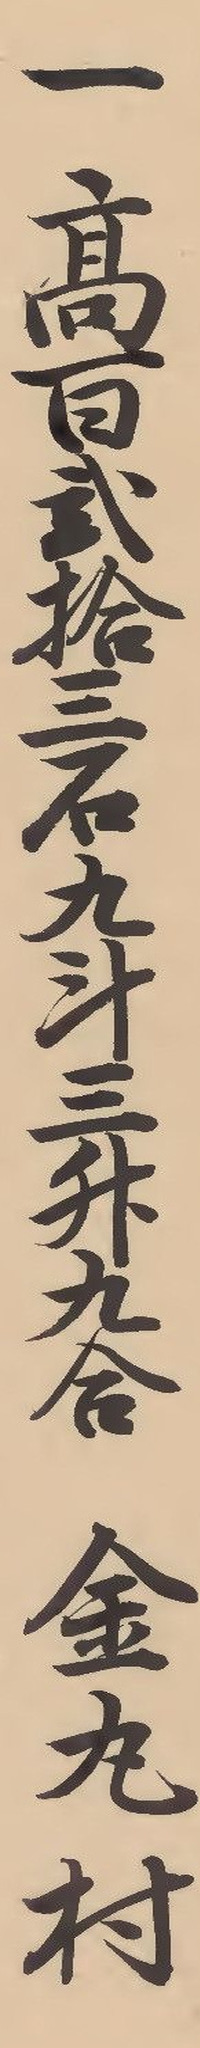一高百弐拾三石九斗三升九合金丸村
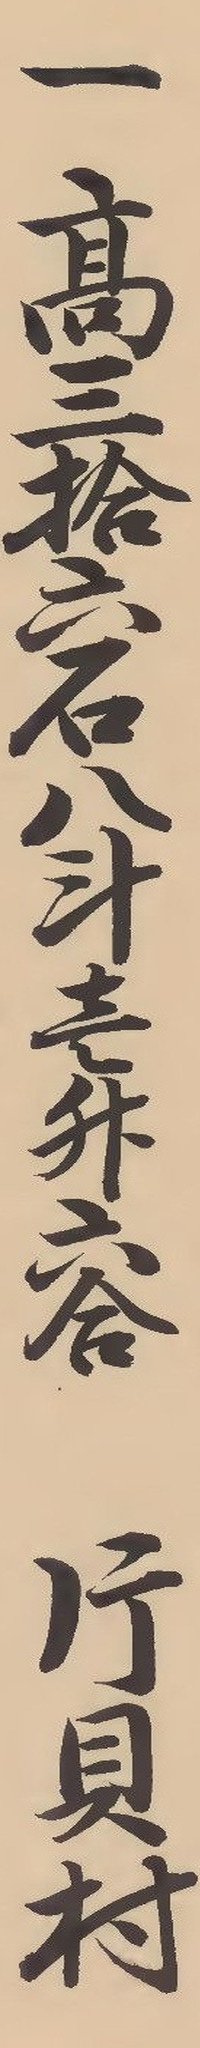一高三拾六石八斗壱升六合片貝村
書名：越後国郷帳　下
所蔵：国立公文書館 National Archives of Japan
